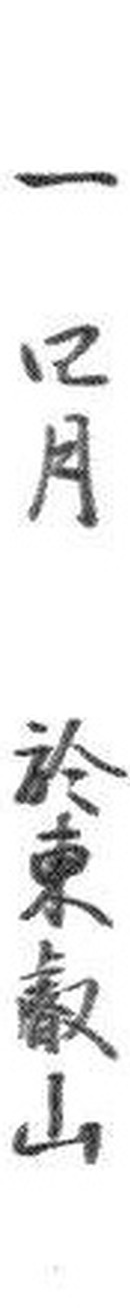一四月於東叡山
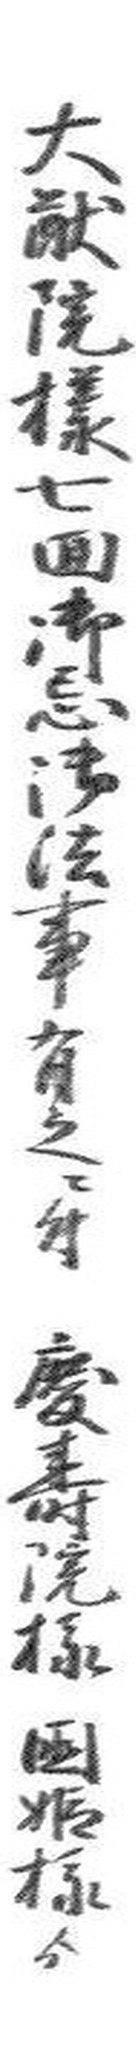大猷院様七回御忌御法事有之ニ付慶寿院様国姫様ゟ
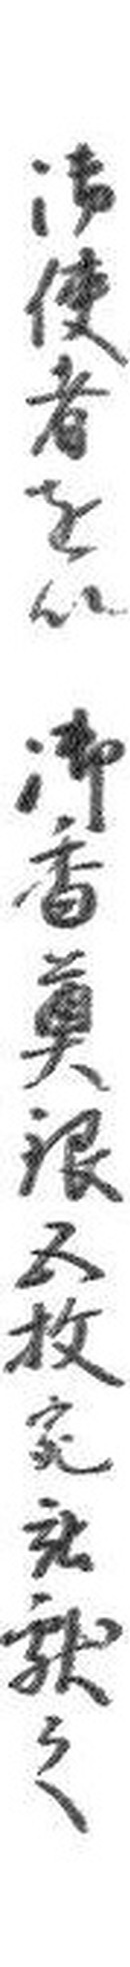御使者を以御香奠銀五枚宛被献之

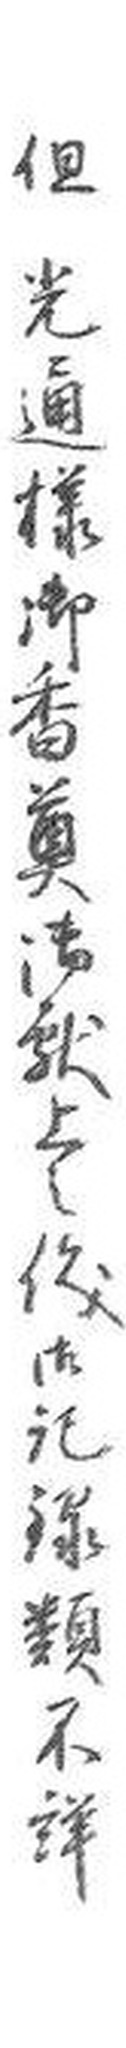但光通様御香奠御献上之儀御記録類不詳
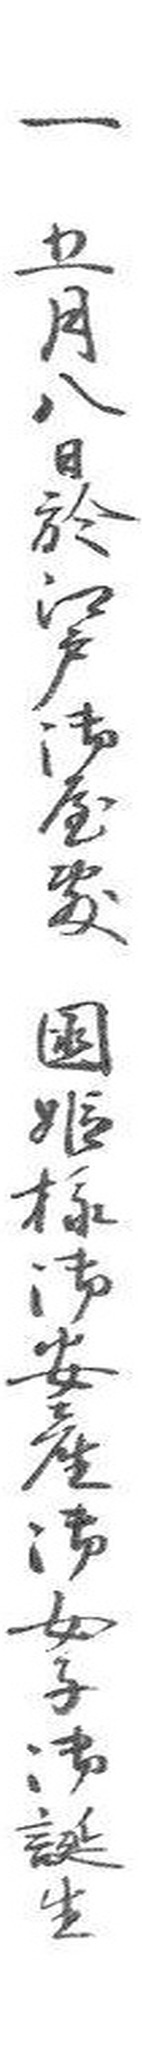一五月八日於江戸御屋敷国姫様御安産御女子御誕生
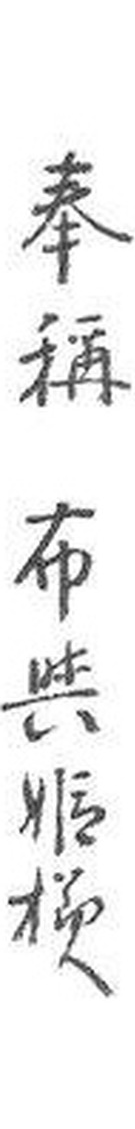奉称布与姫様
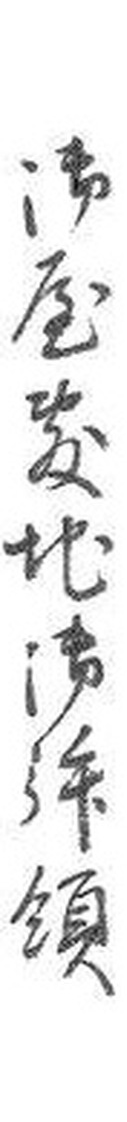御屋敷地御拝領
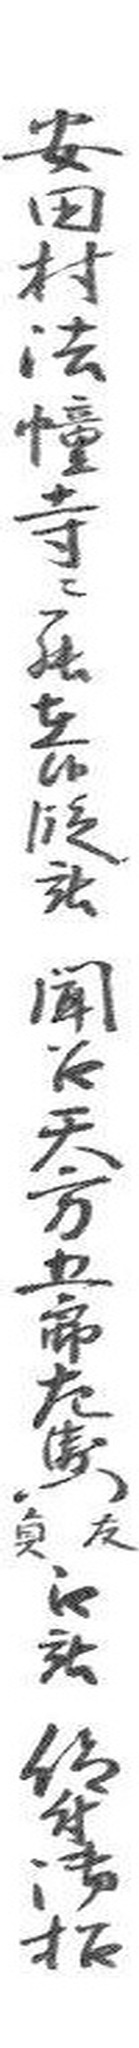安田村法幢寺ニ罷在候段被聞召天方五郎左衛門友貞江被仰
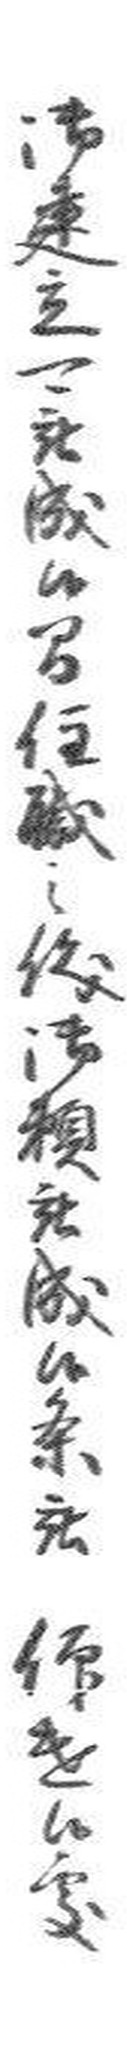御建立可被成候間住職之儀御頼被成候条被仰遣候処
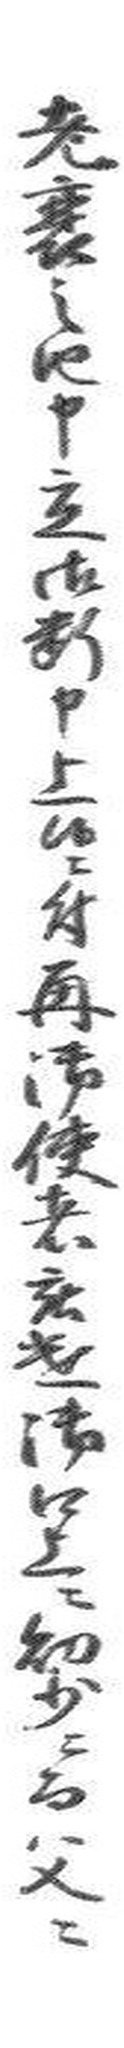老衰之由申立御断申上候ニ付再御使者被遣御口上ニ幼少ニ
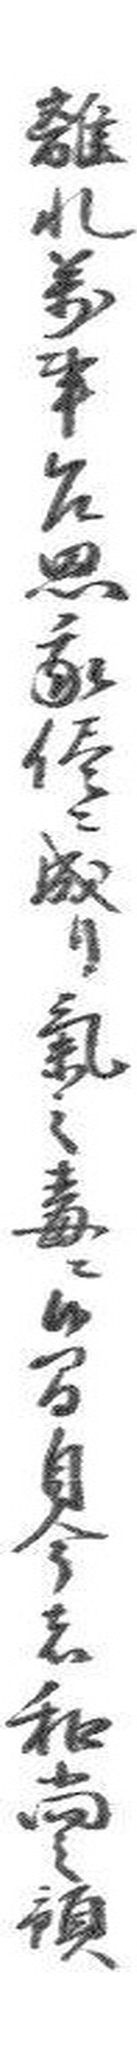離れ万事乍思我儘ニ成リ気之毒ニ候間自今者和尚之預
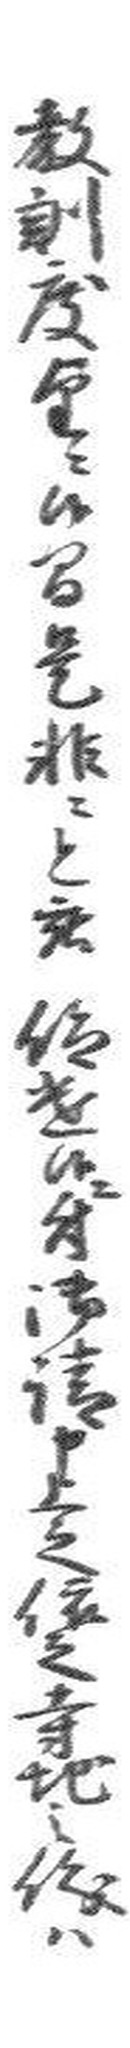教訓度望ニ候間是非ニと被仰遣候ニ付御請申上之依之寺地
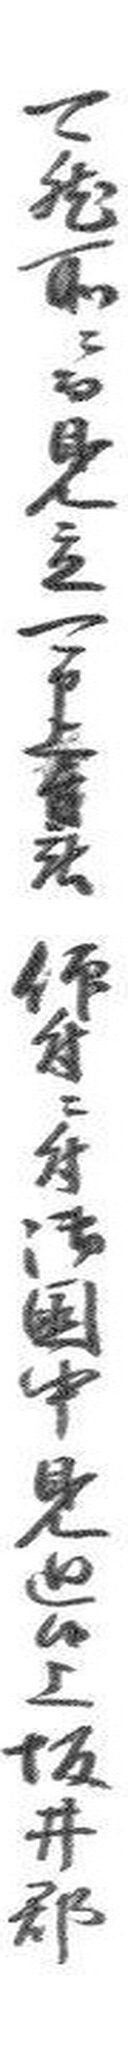可然所ニ而見立可申上旨被仰付ニ付御国中見廻候上坂井郡
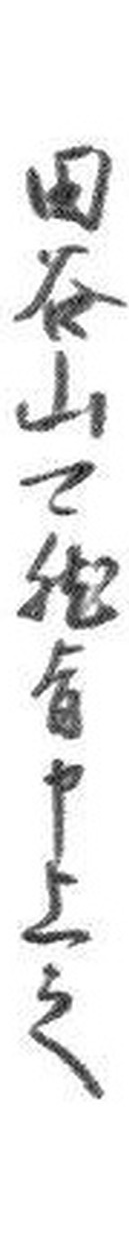田谷山可然旨申上之
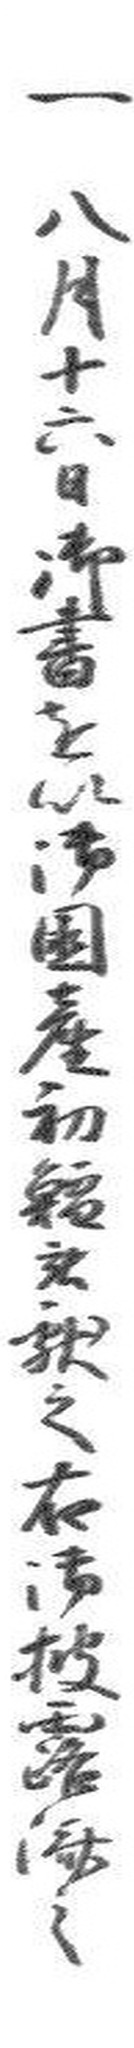一八月十六日御書を以御国産初鱈被献之右御披露済之
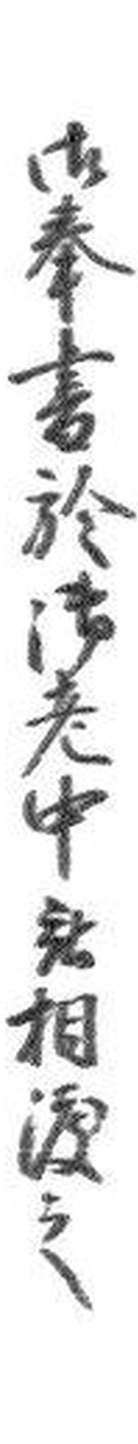御奉書於御老中被相渡之
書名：家譜 五 光通公 従寛永十三年到万治二年
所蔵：福井県文書館 Fukui Prefectural Archives
